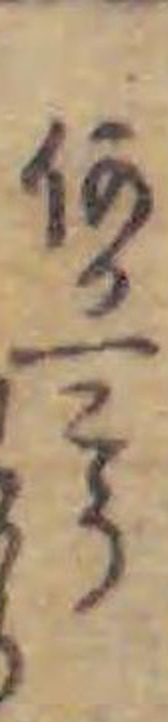何か一こう

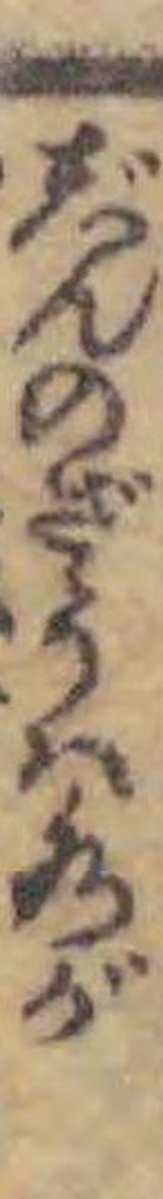じんのざうは水が
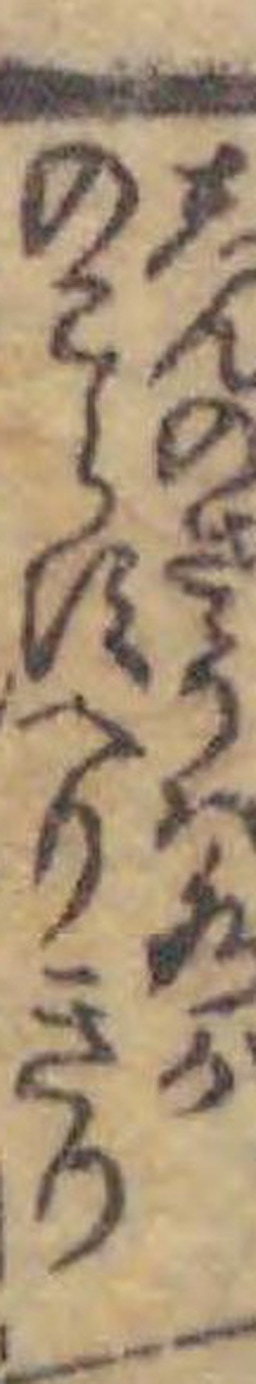のこらすへりきり
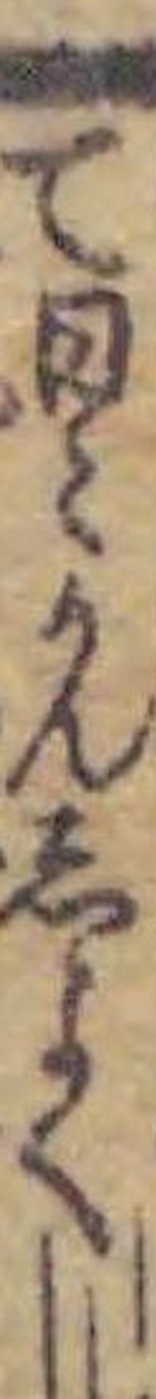て日々かんしよく
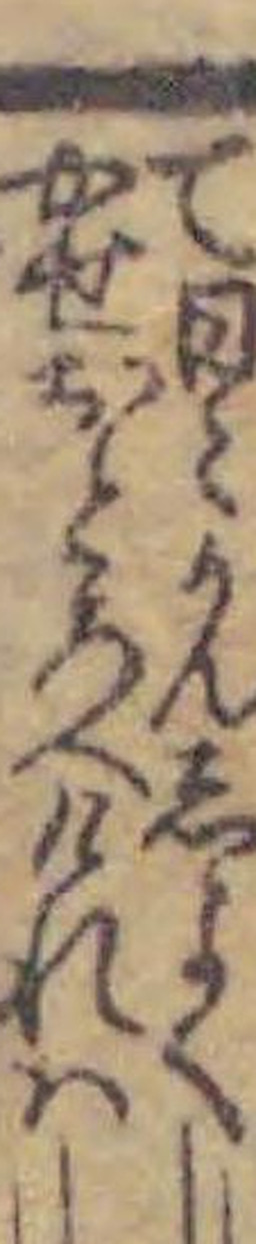やせおとろへけれは
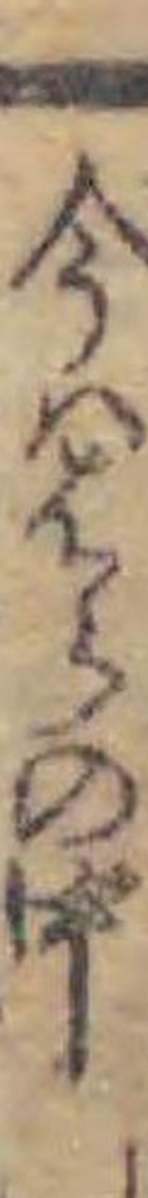今ははらの中
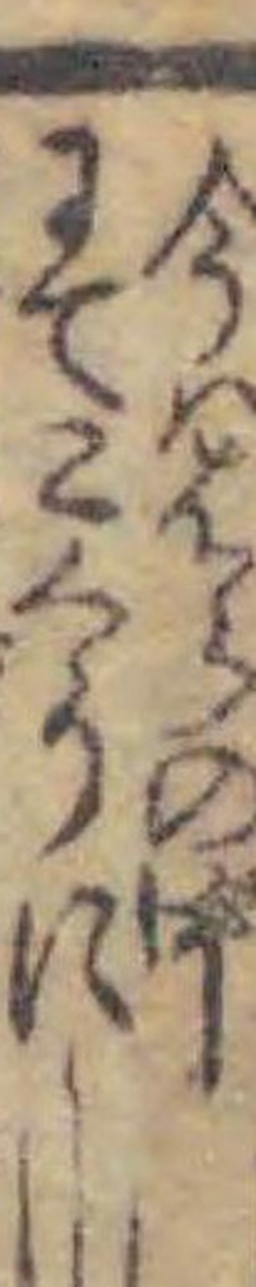にてこくうに
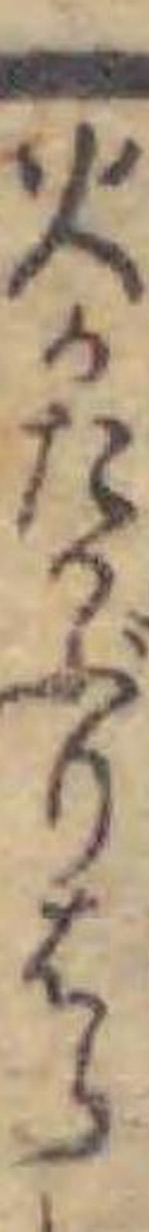火かたかぶりはら
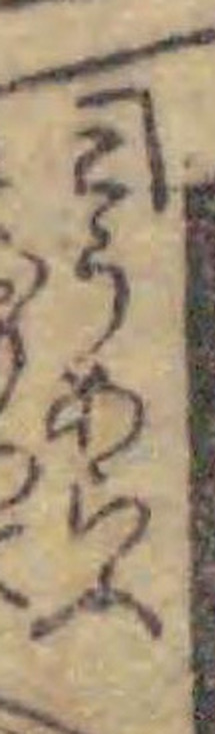〽こうあらふ
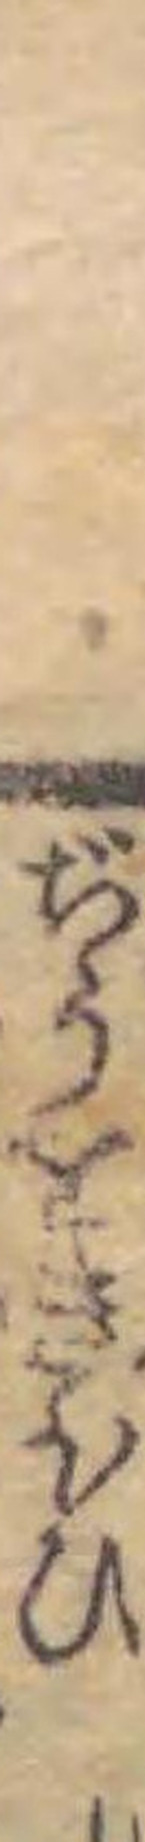ぢうをきほひ
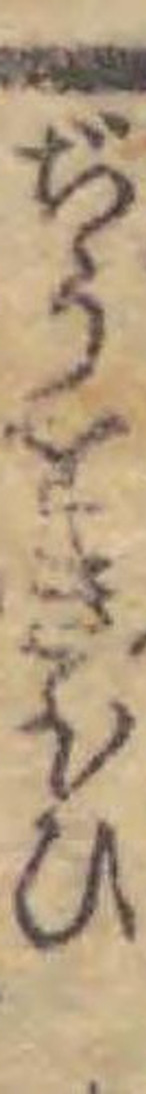ぢうをきほひ
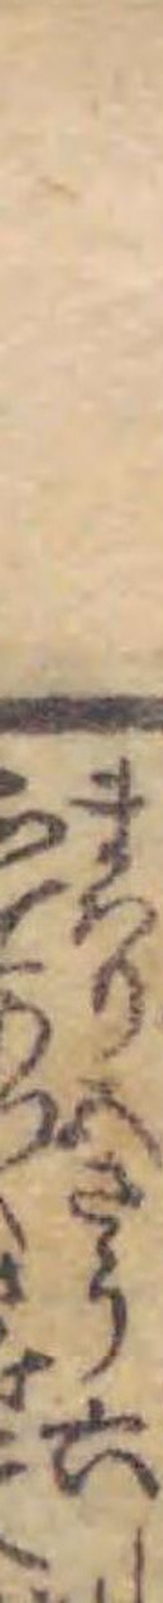まはり五さう六
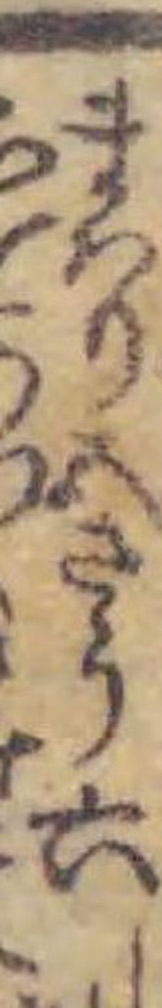まはり五さう六
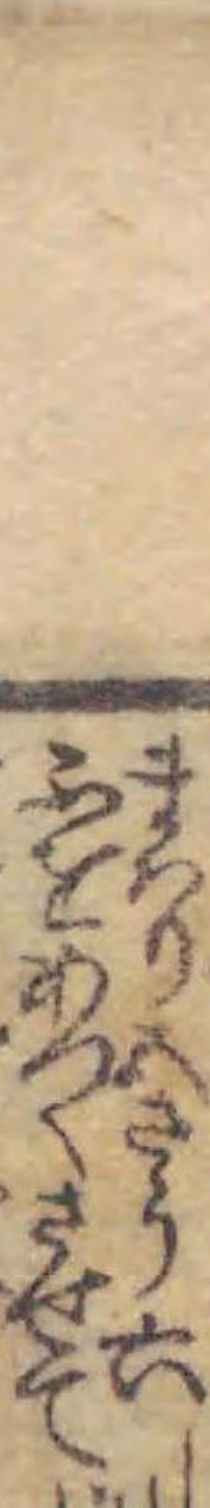ふをあつくさせて
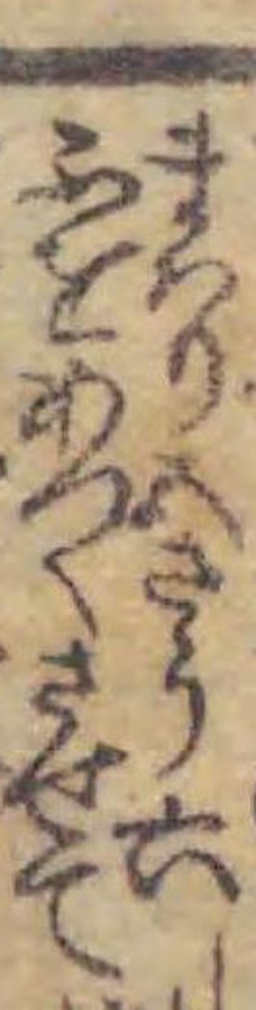ふをあつくさせて
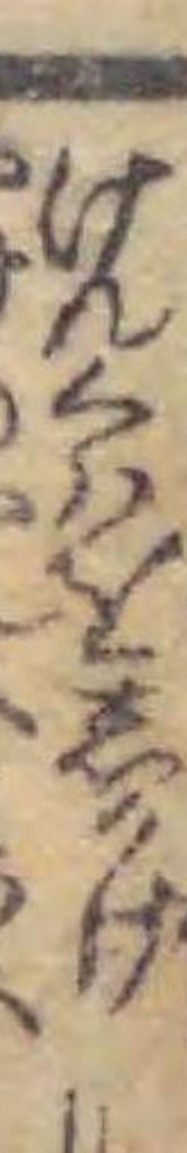けんくはをしかけ
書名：十四傾城腹之内 : 3巻
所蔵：国立国会図書館 National Diet Library, JAPAN
